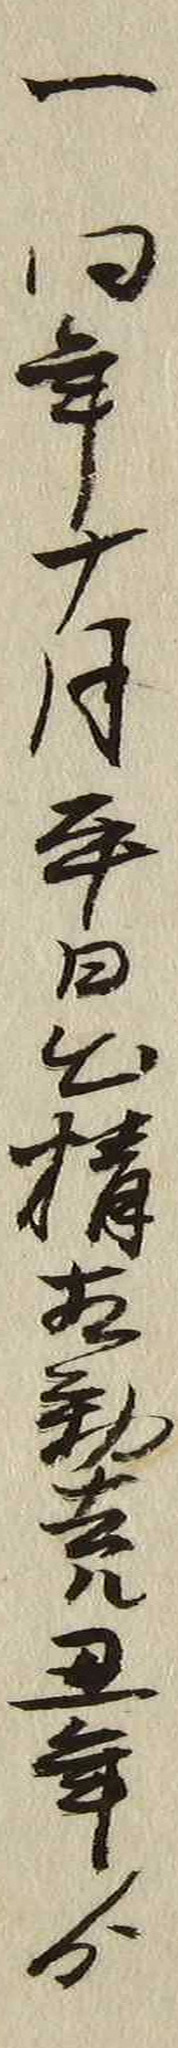一同年十月平日出精相勤去ル丑年ゟ
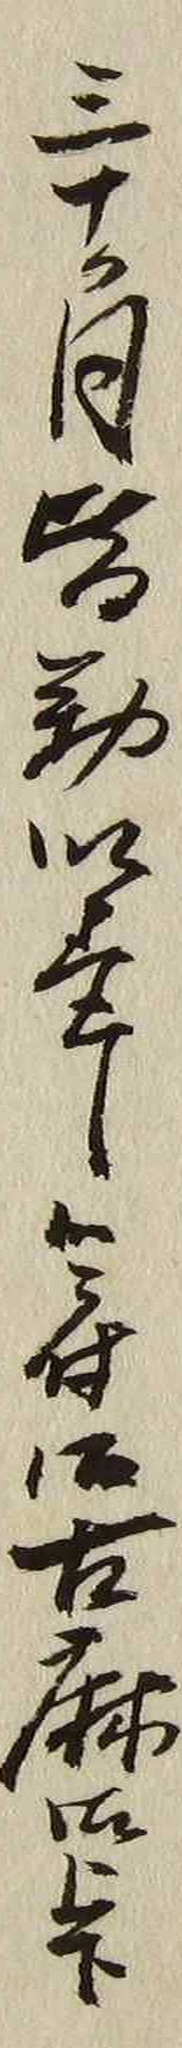三十ケ月皆勤いたし候ニ付御古麻御上下
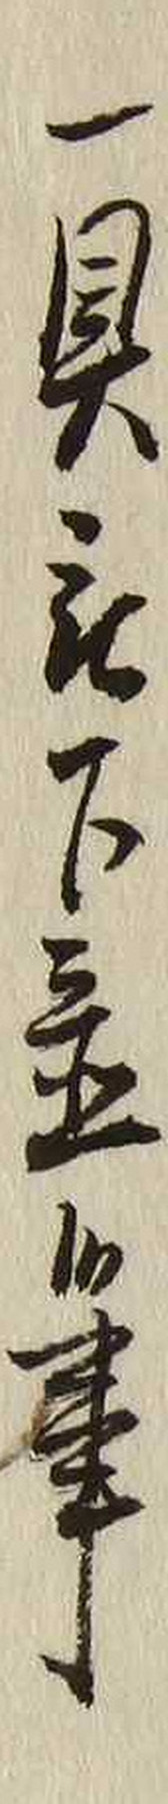一具被下置候事
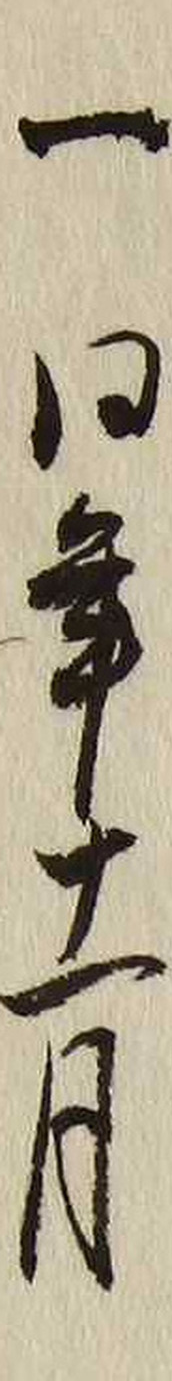一同年十一月
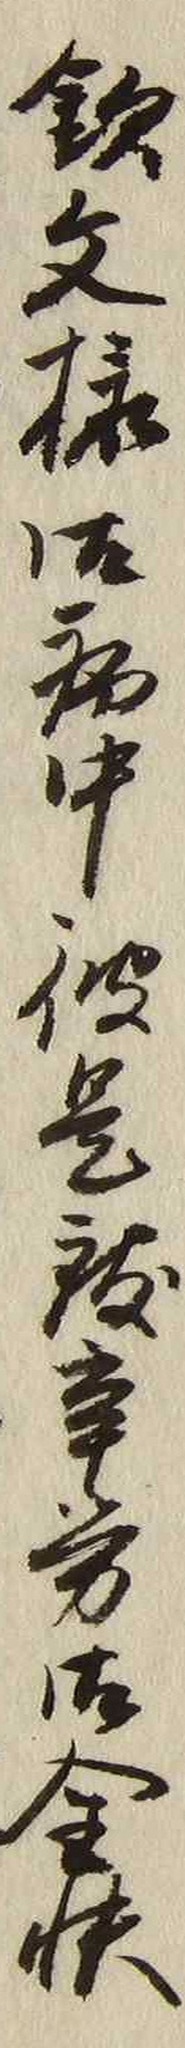欽文様御病中彼是致辛労御全快
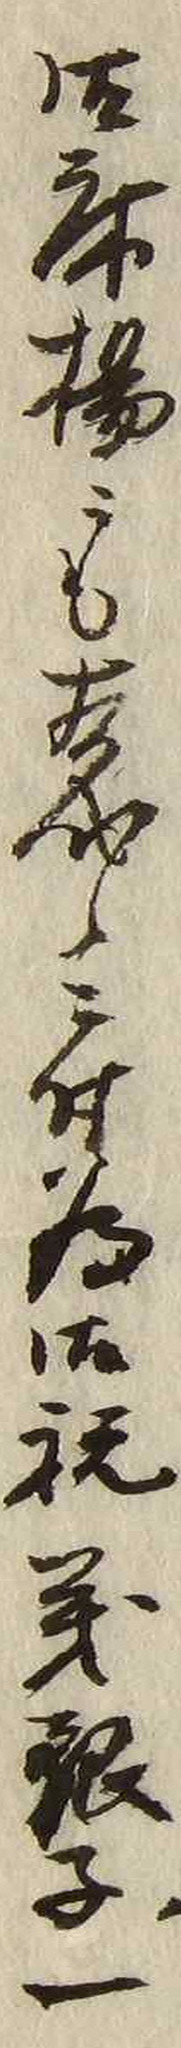御床揚ニも相成候ニ付為御祝義銀子一

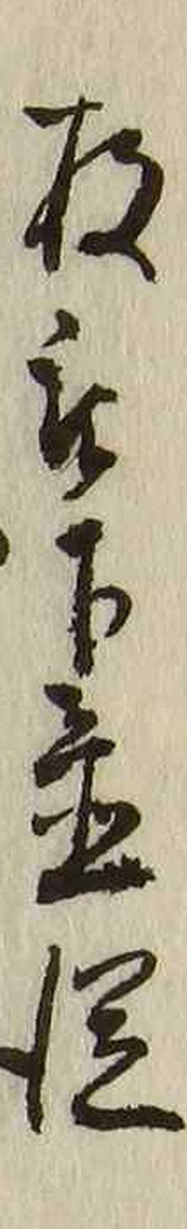枚被下置従
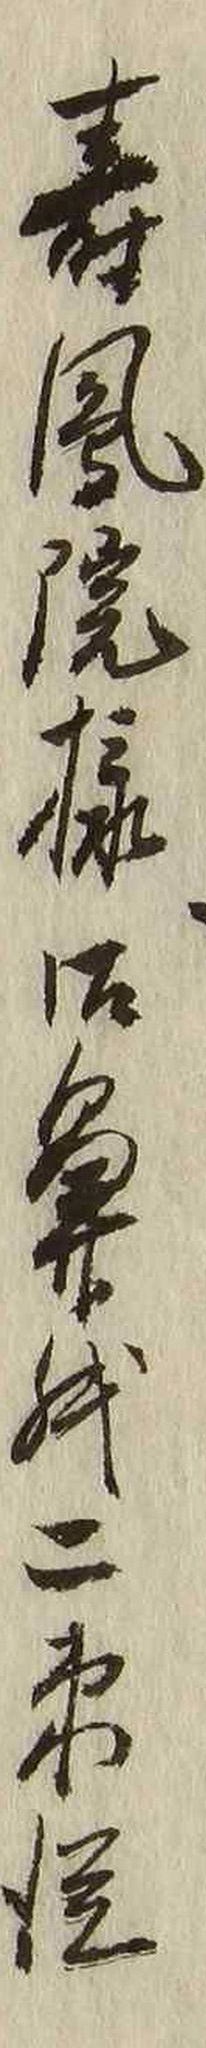寿鳳院様御鼻紙二束従
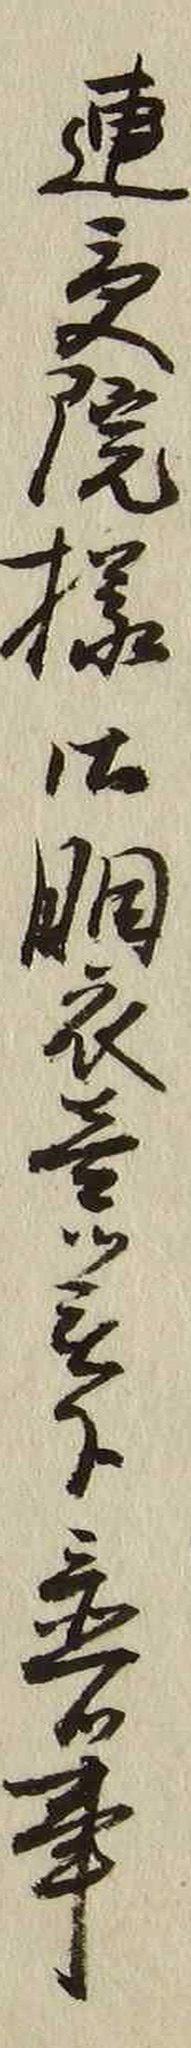連受院様御胴衣壱ツ被下置候事
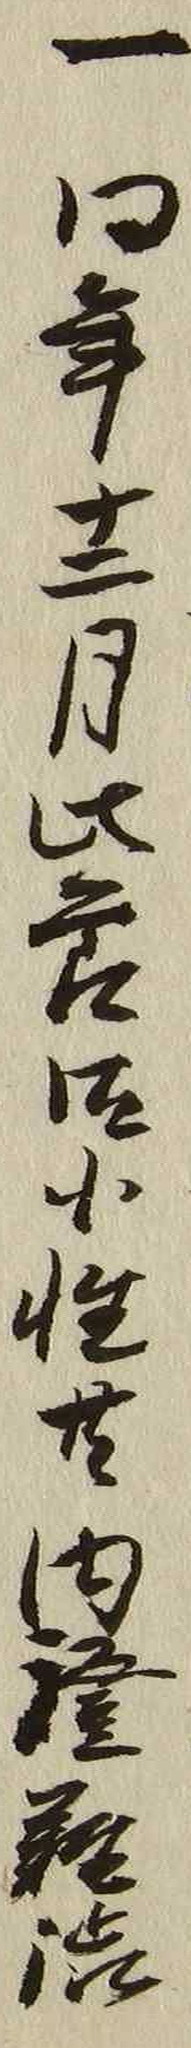一同年十二月此節御小性共内証難渋
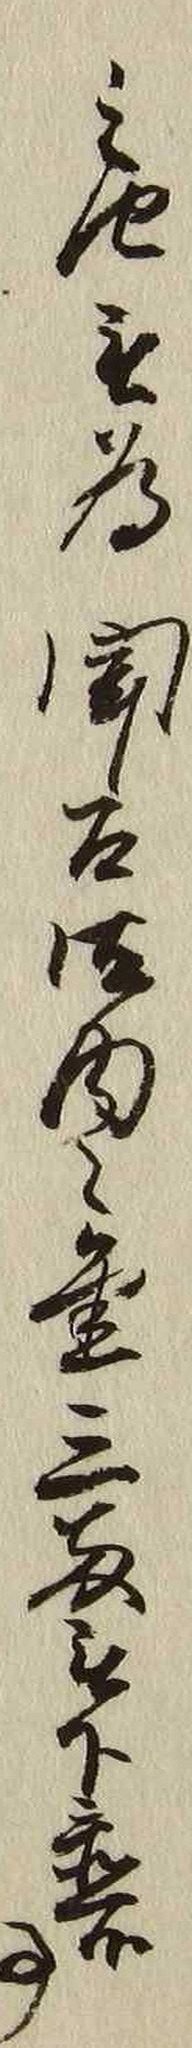之由被為聞召御内々金三両被下置候事
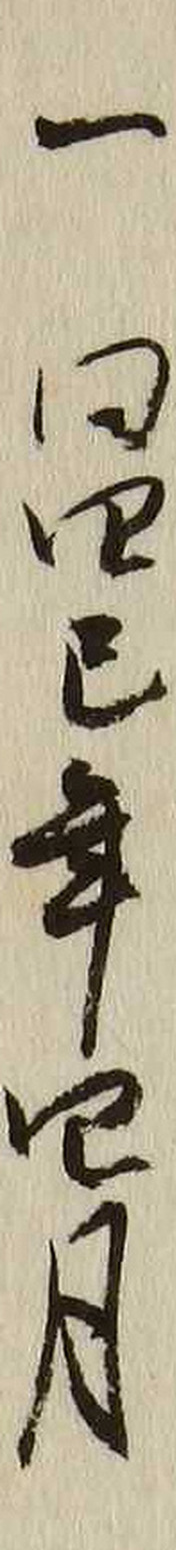一同四巳年四月
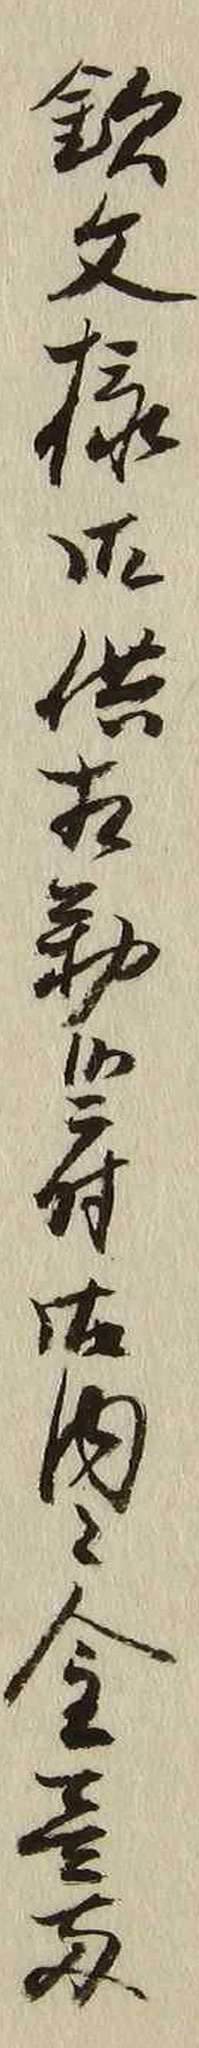欽文様御供相勤候ニ付御内々金壱両
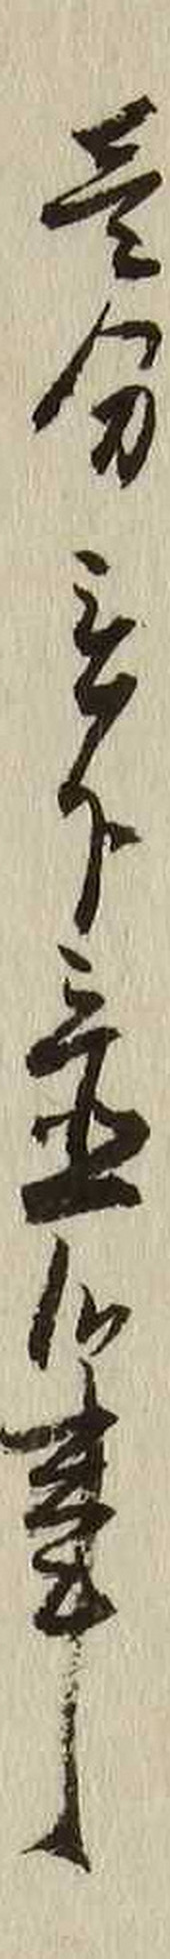壱分被下置候事
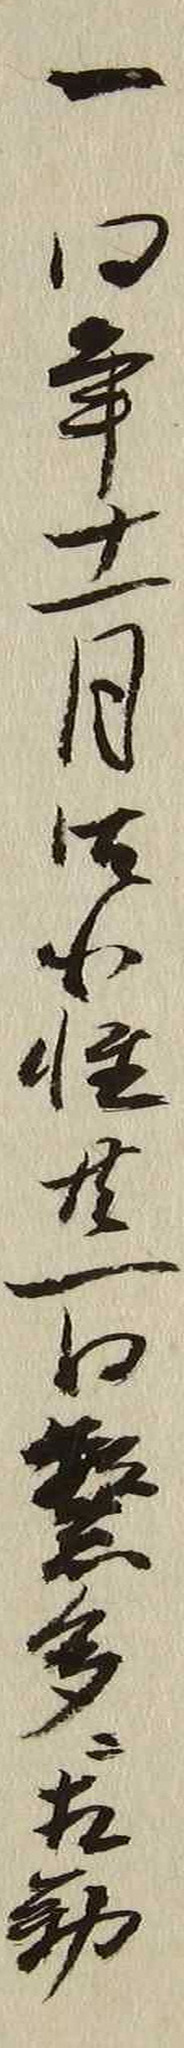一同年十一月御小性共一同繁多ニ相勤
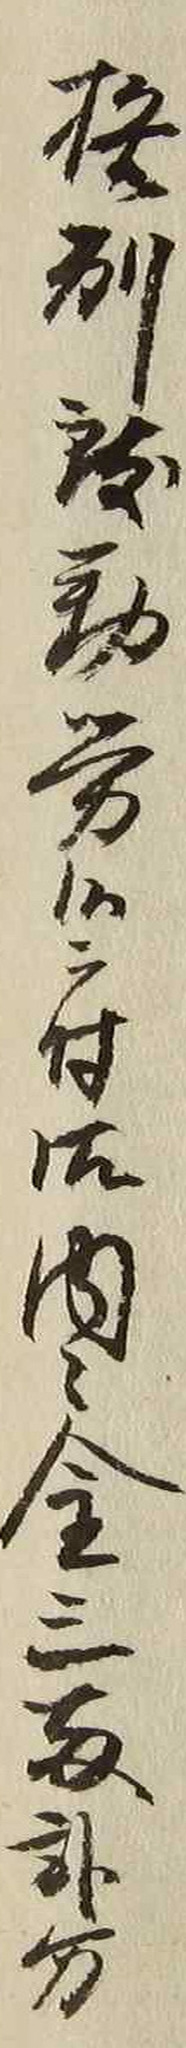格別致勤労候ニ付御内々金三両弐分
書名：諸士系譜　巻之345　も之部1
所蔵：会津若松市立会津図書館
